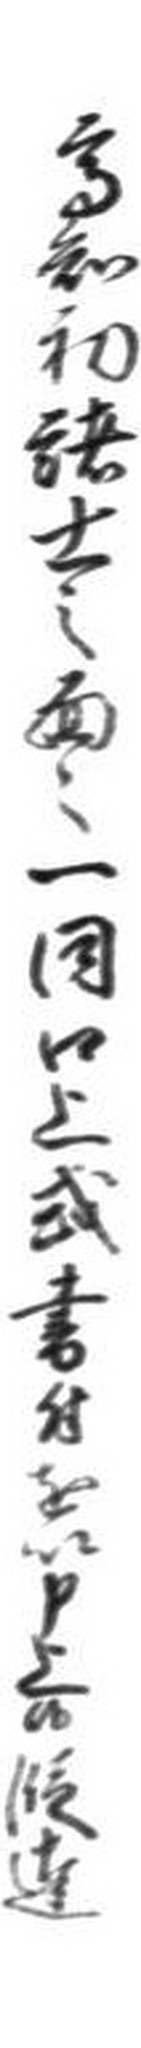高知初諸士之面々一同口上或書付を以申上候段達
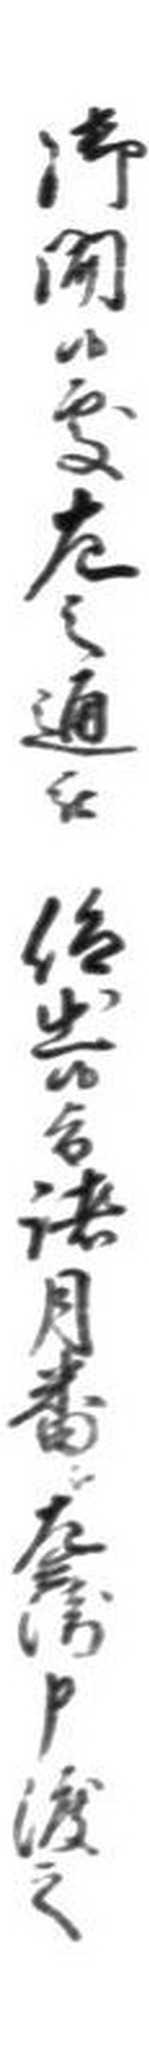御聞候處左之通被仰出候旨諸月番江左兵衛申渡之
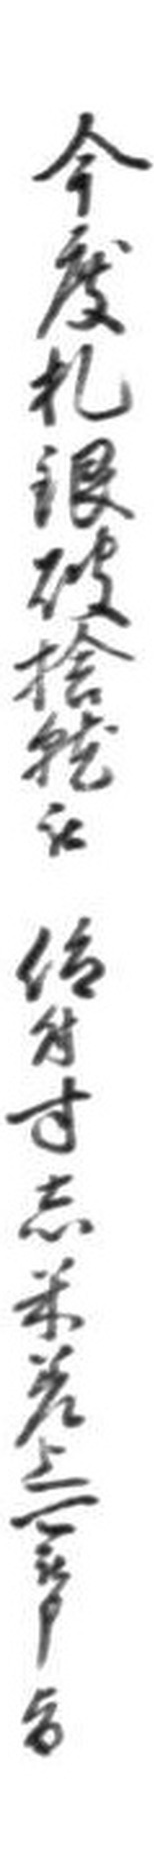今度札銀破捨就被仰付寸志米差上可被申旨

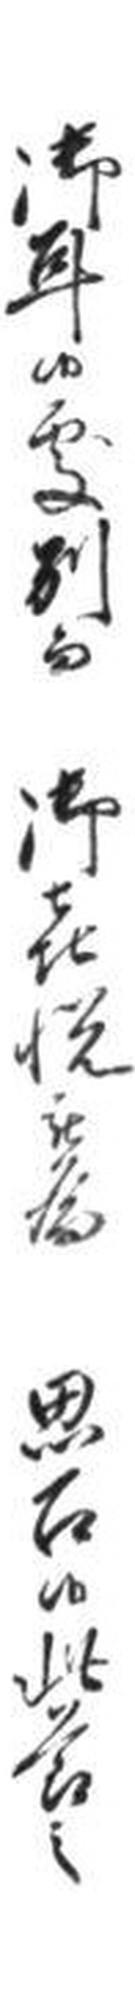御耳候処別而御喜悦被為思召候此節之
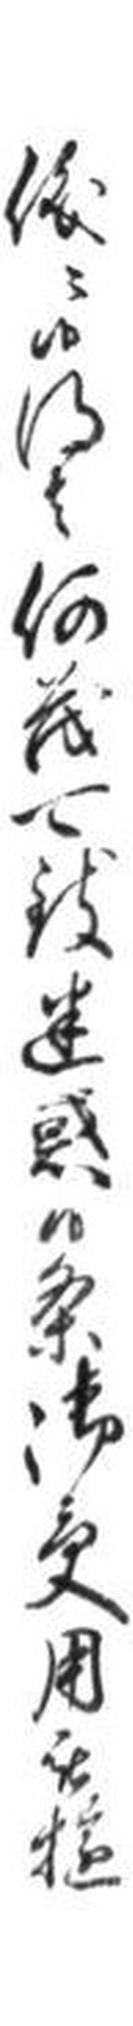儀ニ候得者何茂可致迷惑候条御受用被遊
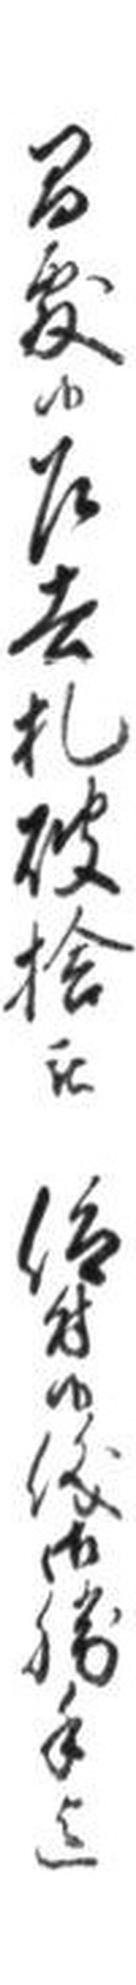間敷候乍去札破捨被仰付候儀御勝手迄
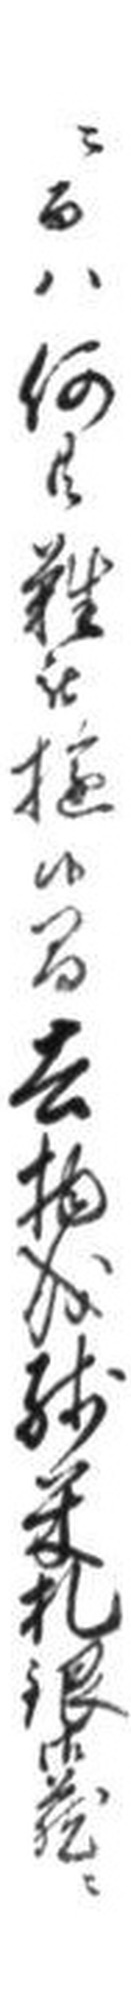ニ而ハ何共難被遊候間去物成残米札銀御蔵ニ
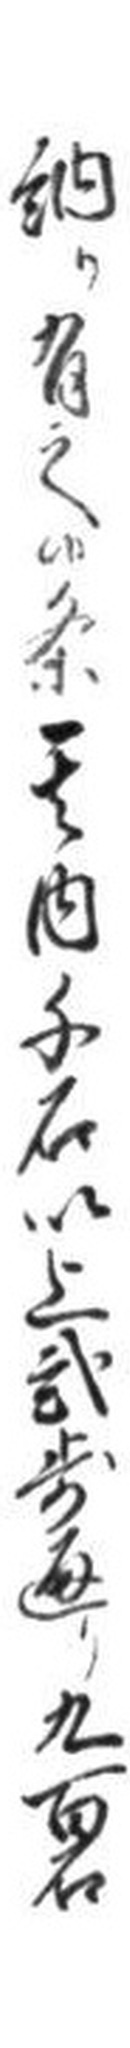納り有之候条其内千石以上弐歩通り九百石
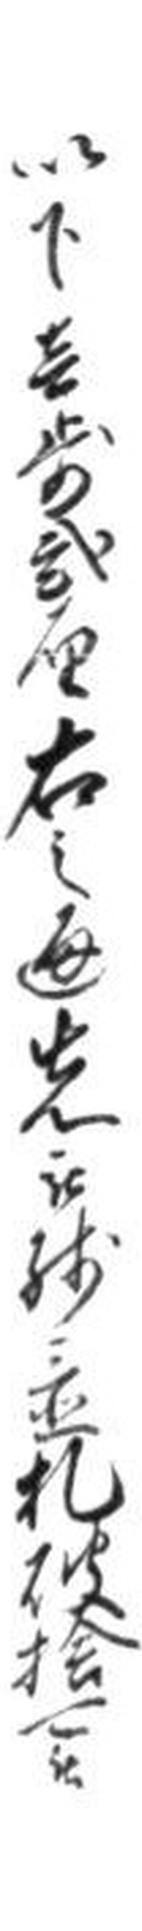以下壱歩弐厘右之通先被残置札破捨可被
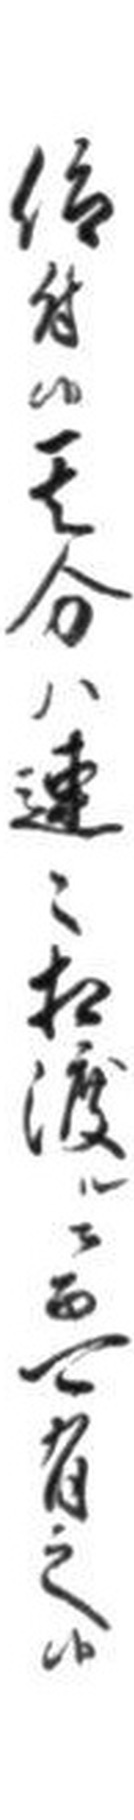仰付候其分ハ速々相渡ルニ而可有之候
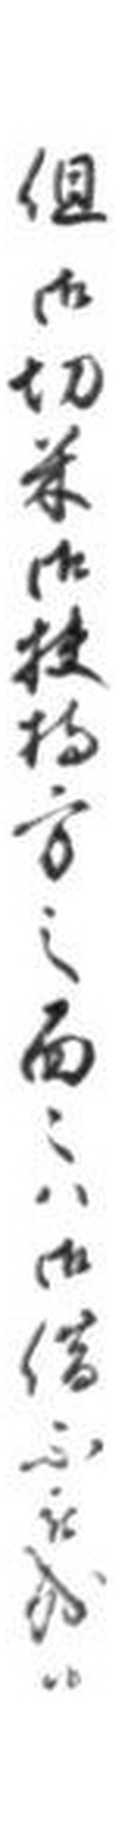但御切米御扶持方之面々ハ御借不被成候
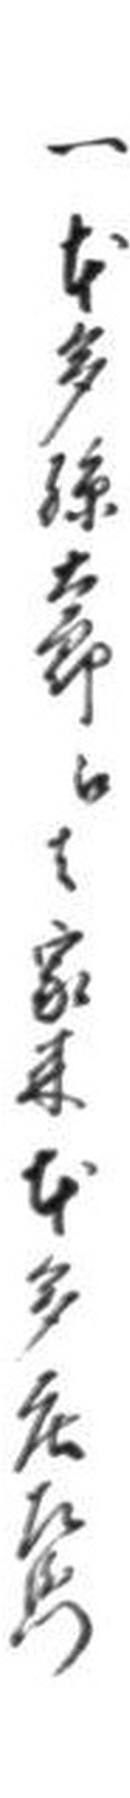一本多孫太郎江者家来本多庄左衛門
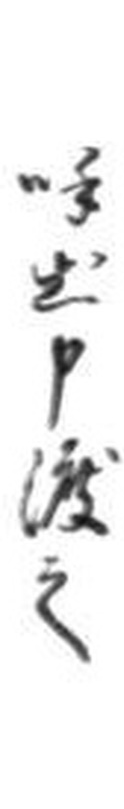呼出申渡之
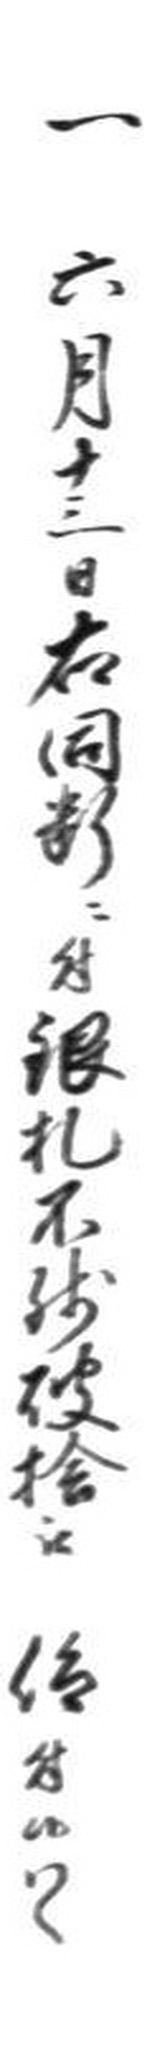一六月十三日右同断ニ付銀札不残破捨被仰付候ハヽ
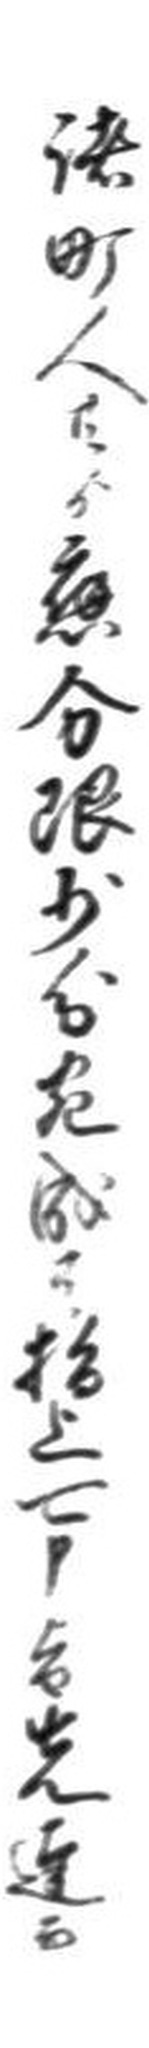諸町人共ゟ応分限少分宛成共指上可申旨先達而
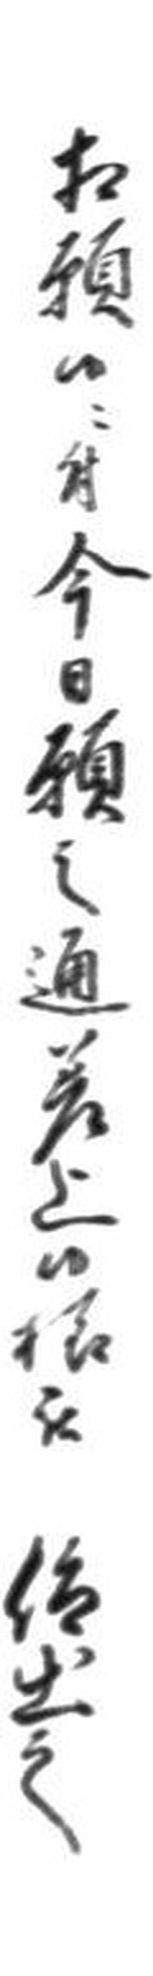相願候ニ付今日願之通差上候様被仰出之
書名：家譜 十六 吉品公 従貞享三年閏三月到同四年
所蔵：福井県文書館 Fukui Prefectural Archives
